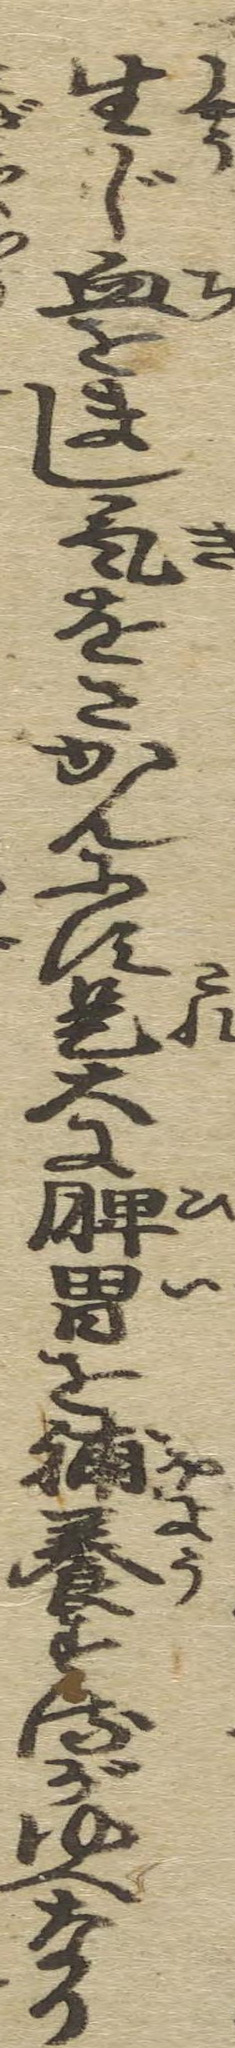生じ血をまし気をさかんにす是大に脾胃を補養するがゆへなり
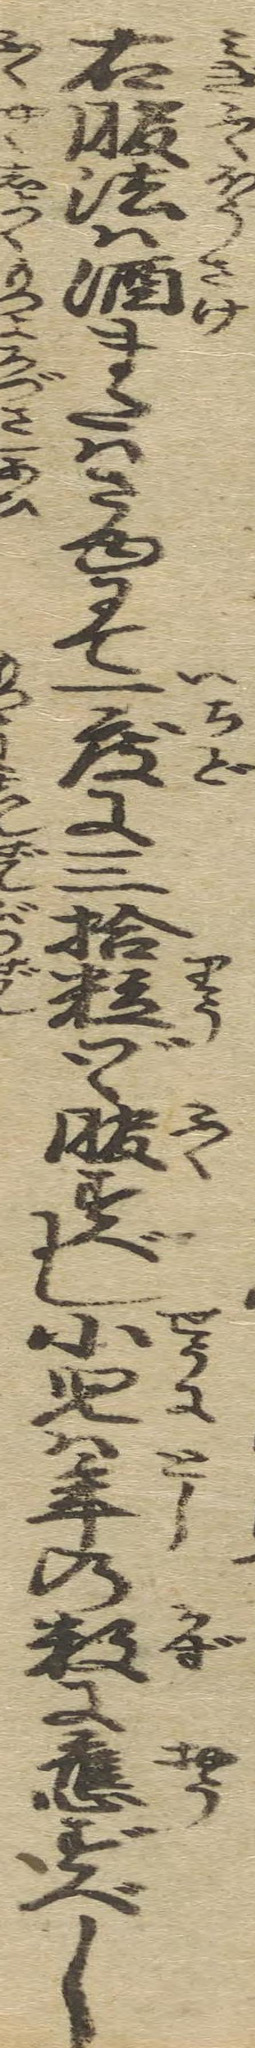右服法は酒またはさゆにて一度に三拾粒ヅヽ服すべし小児は年の数に応ずべし
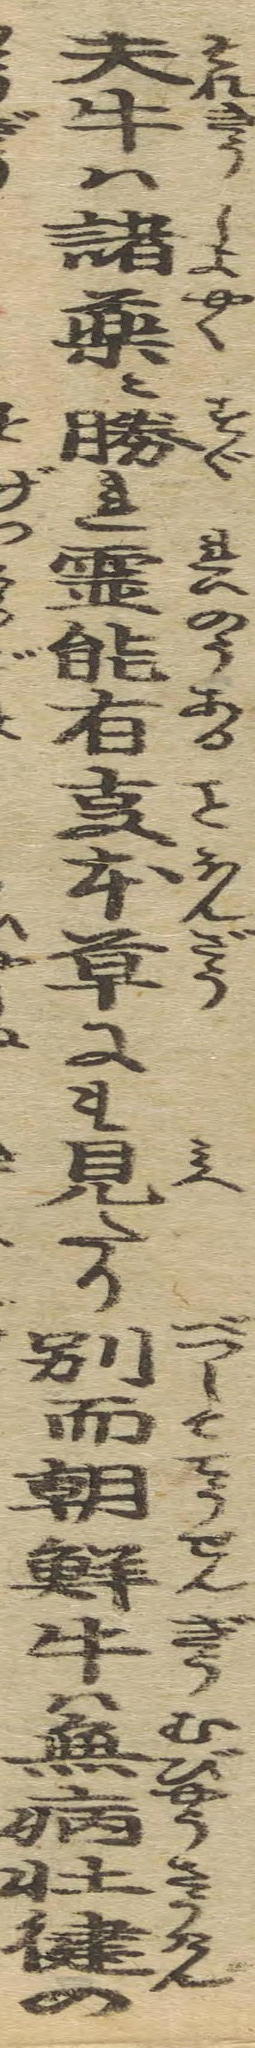夫牛は諸薬ニ勝れ霊能有事本草にも見たり別而朝鮮牛は無病壮健の
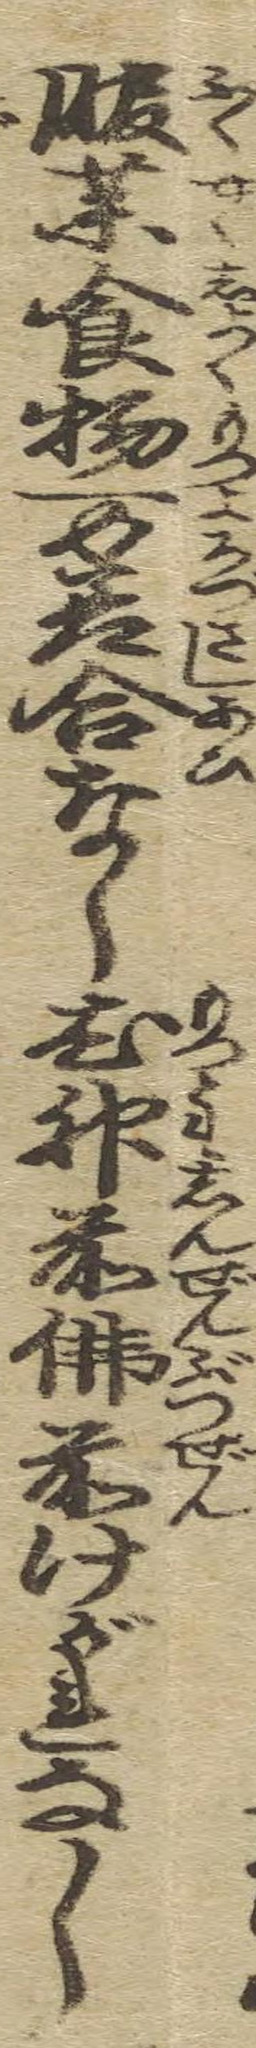服薬食物万差合なし尤神前仏前けがれなし
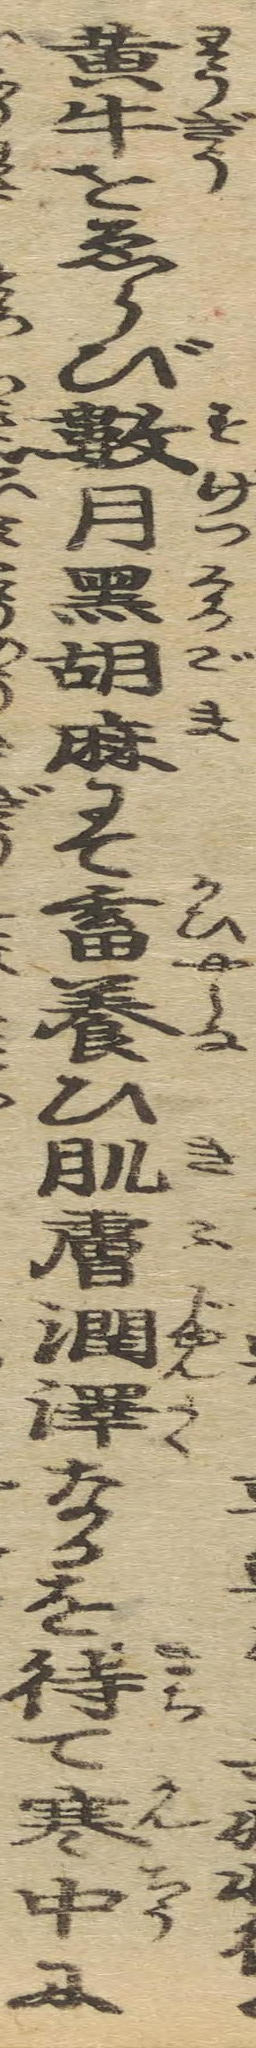黄牛をゑらび数月黒胡麻にて畜養ひ肌膚潤沢なるを待て寒中に
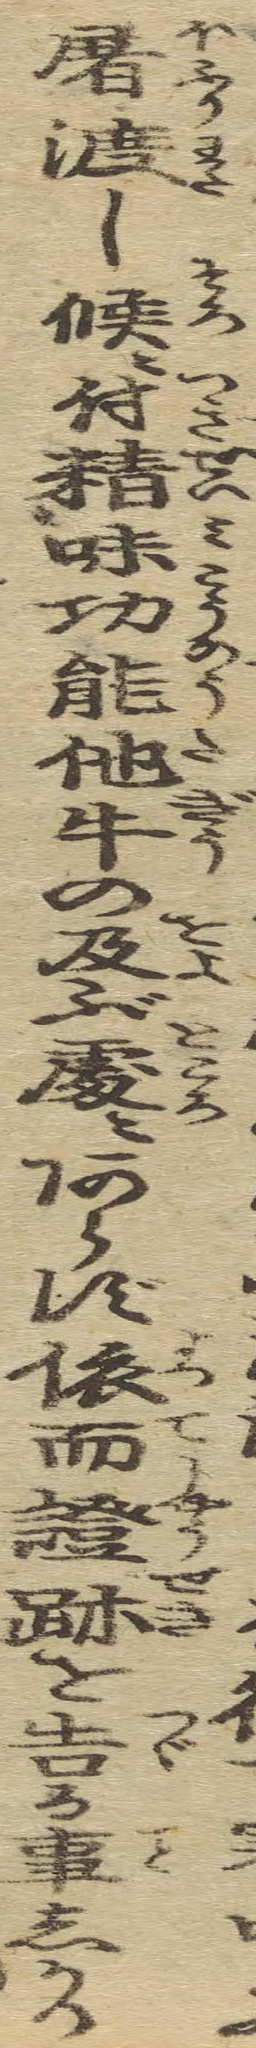屠渡し候ニ付精味功能他牛の及ぶ処ニあらず依て証跡を告る事しかり
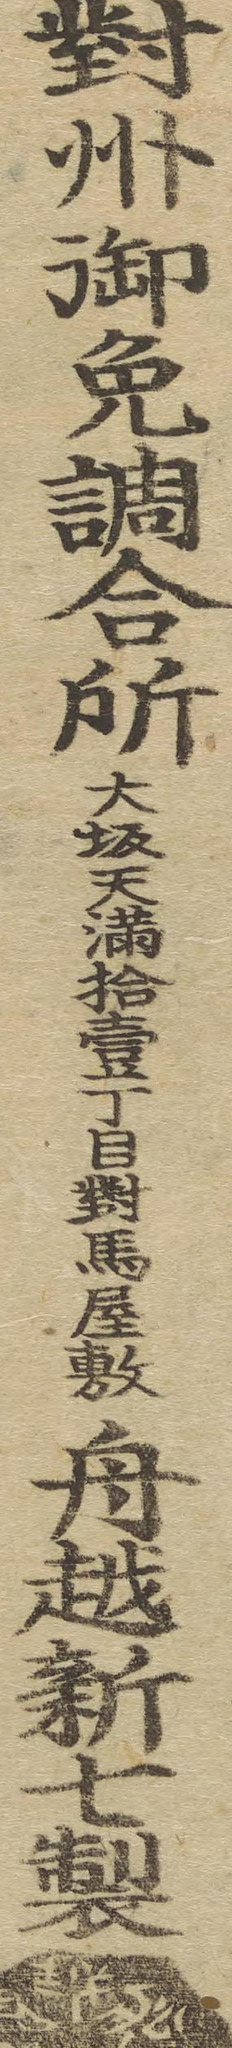対州御免調合所大坂天満拾壱丁目対馬屋敷舟越新七製
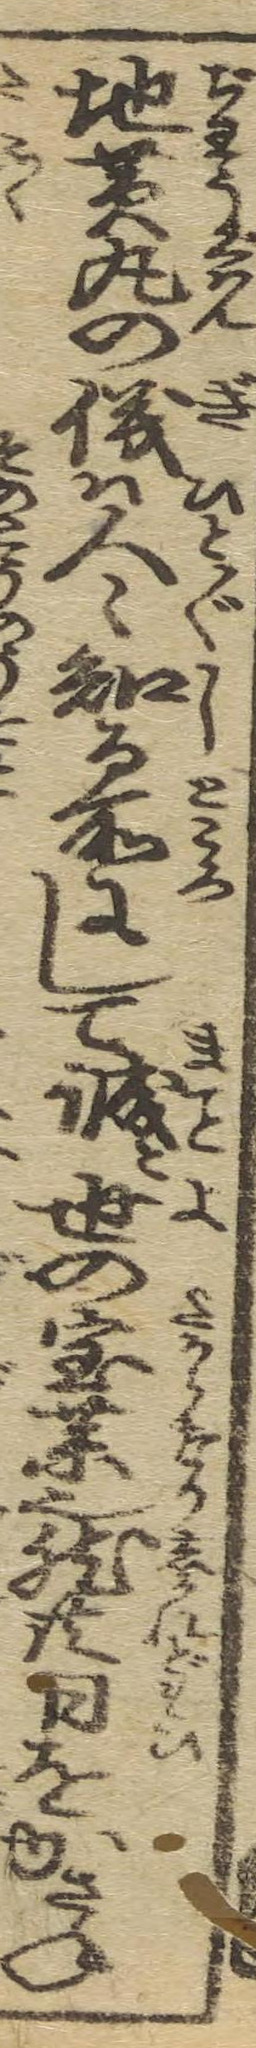地黄丸の儀は人々知る所にして誠ニ世の宝薬也然共日をかさね
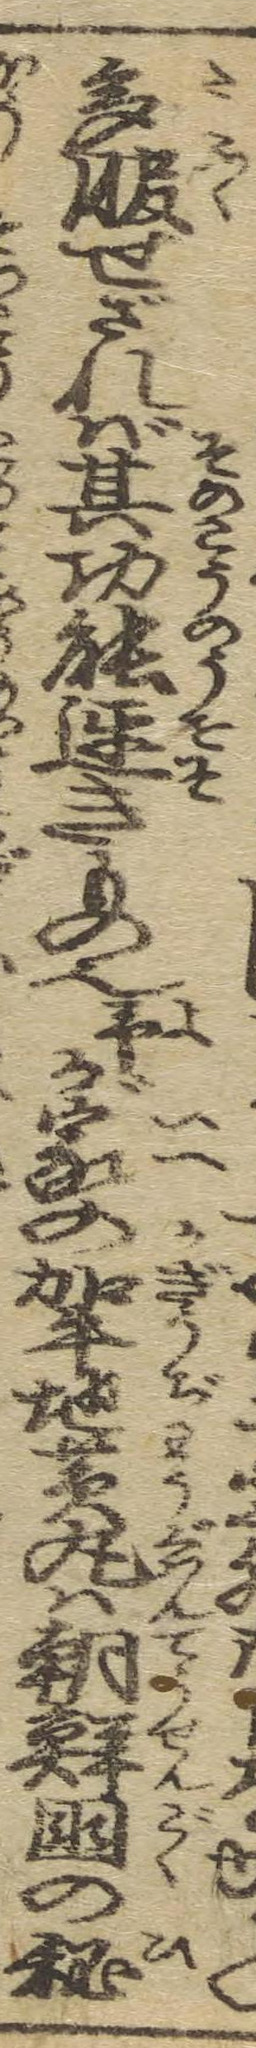多服せざれば其功能遅きもの也予が家の加牛地黄丸は朝鮮国の秘
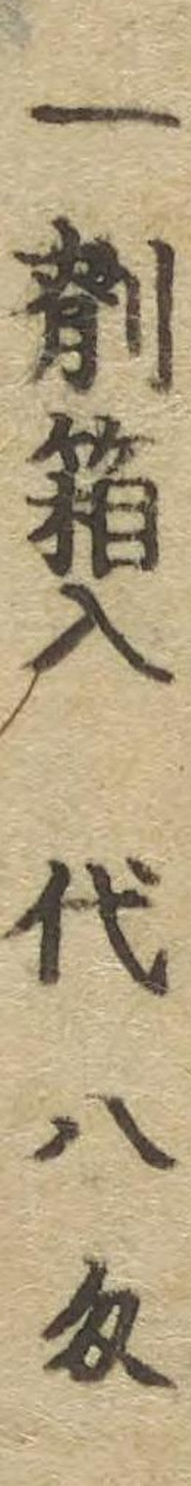一剤箱入代八匁
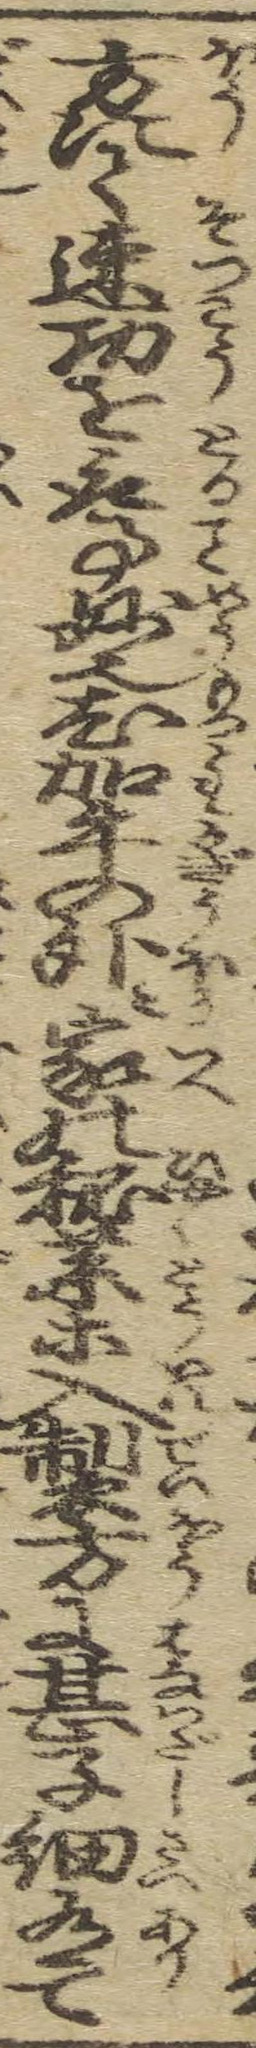方にて速功を取事妙也尤加牛の外ニ家の秘薬等入製方に甚子細有て
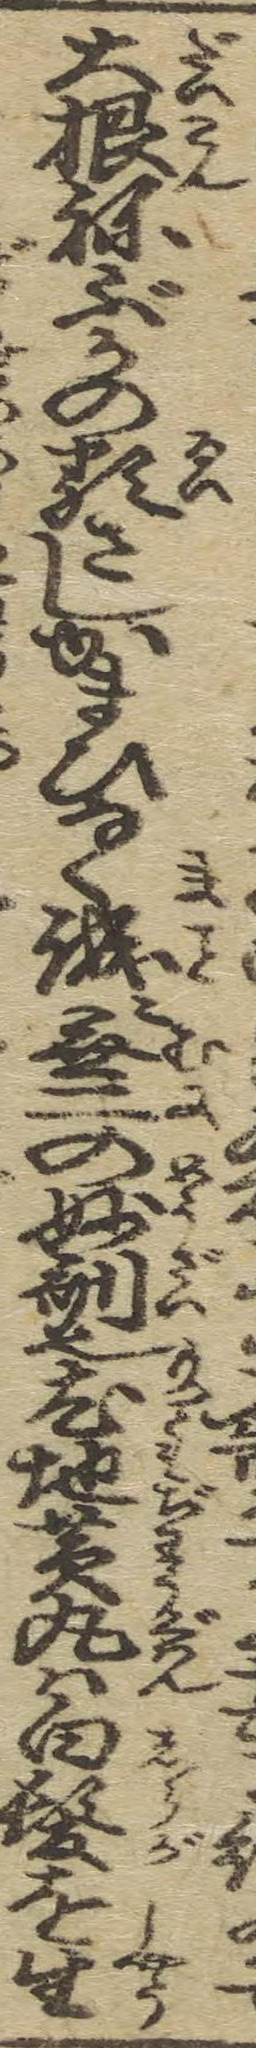大根ねぶかの類さしかまひなく誠ニ無二の妙剤也尤地黄丸は白髪を生
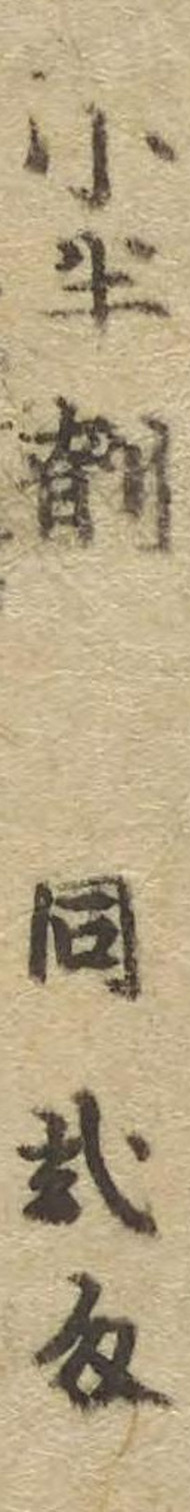小半剤同弐匁
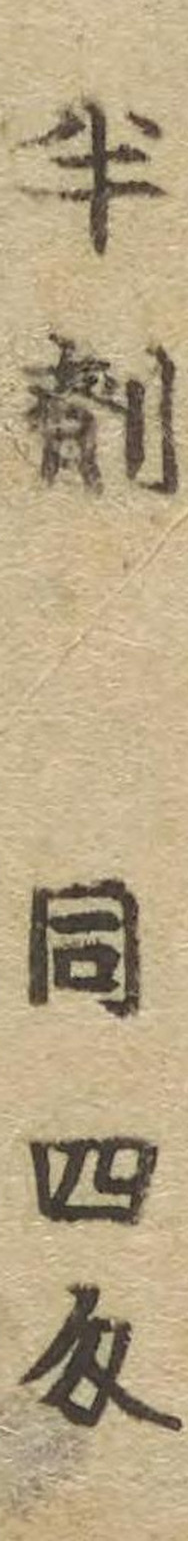半剤同四匁
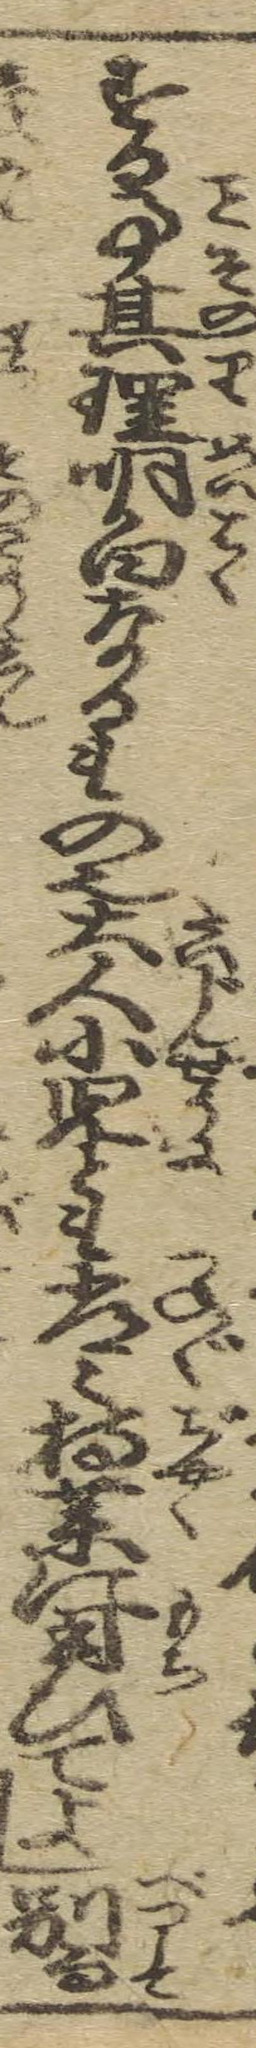する事其理明白なるもの也大人小児とも常々持薬に用ひてよし別而
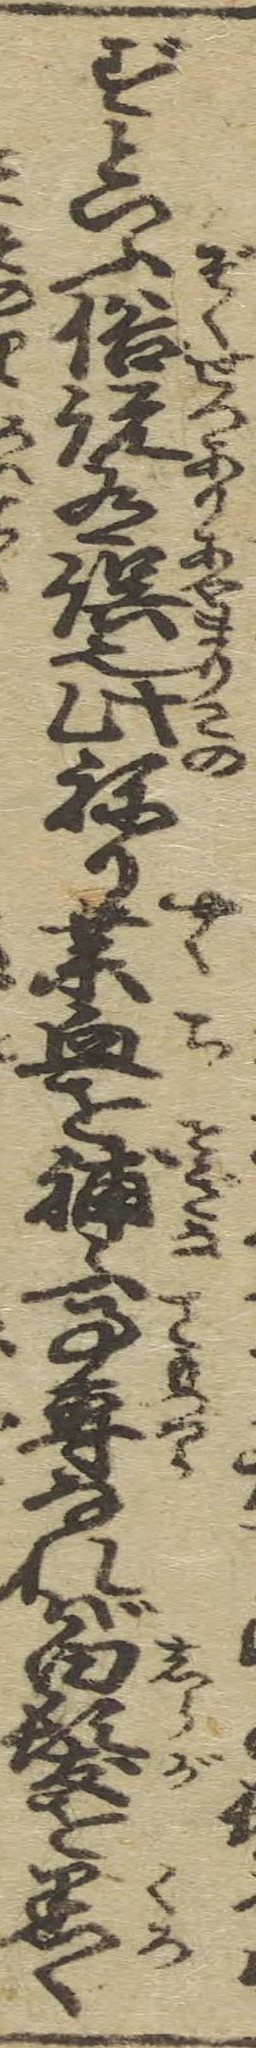ずといふ俗説有誤也此ねり薬血を補ふ事専ならば白髪を黒く
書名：浪華薬種問屋能書張交帖. 二
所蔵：国立国会図書館 National Diet Library, JAPAN
